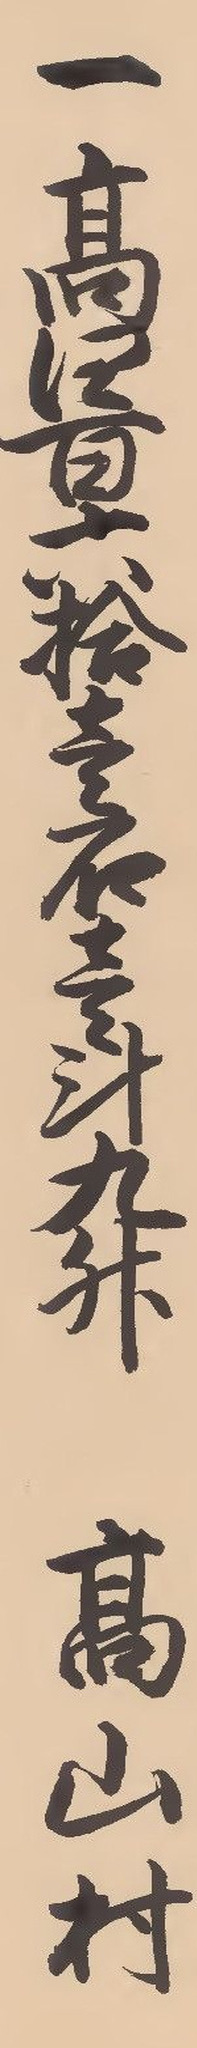一高四百六拾壱石壱斗九升高山村
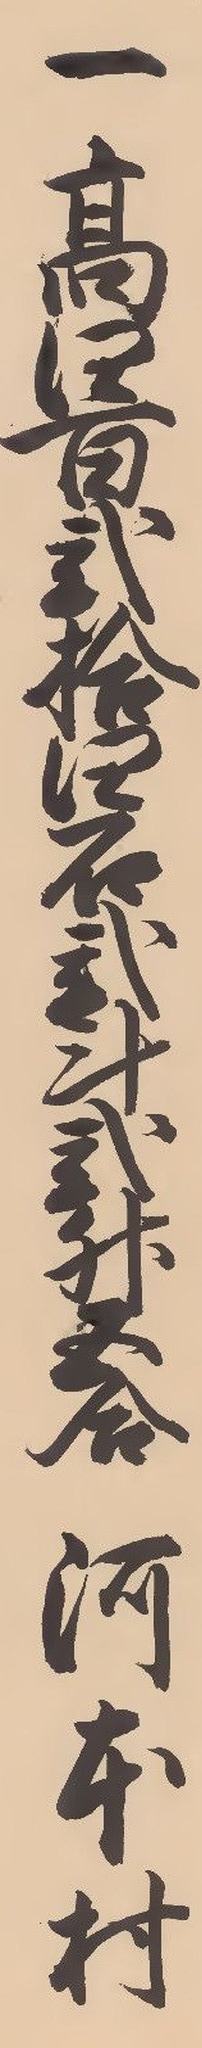一高四百弐拾四石弐斗弐升五合河本村
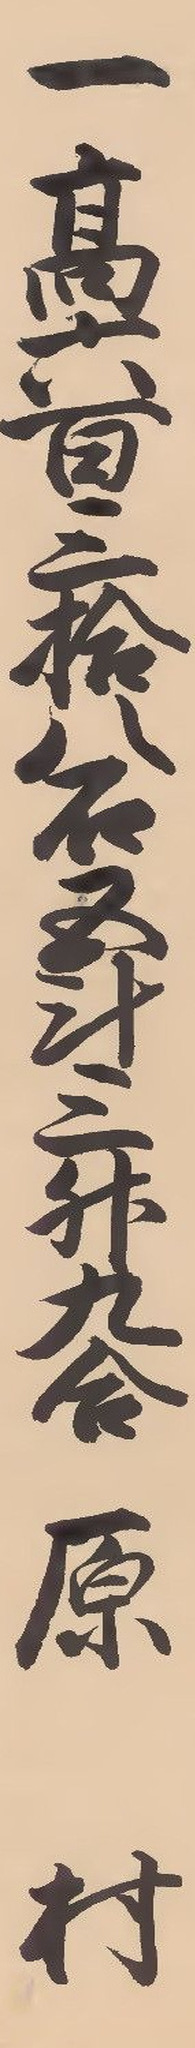一高六百三拾八石五斗三升九合原村
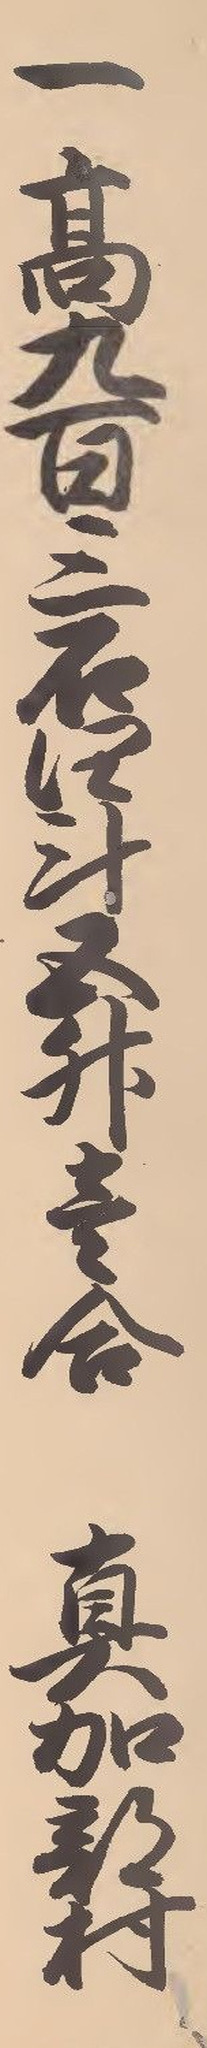一高九百三石四斗五升壱合真加部村
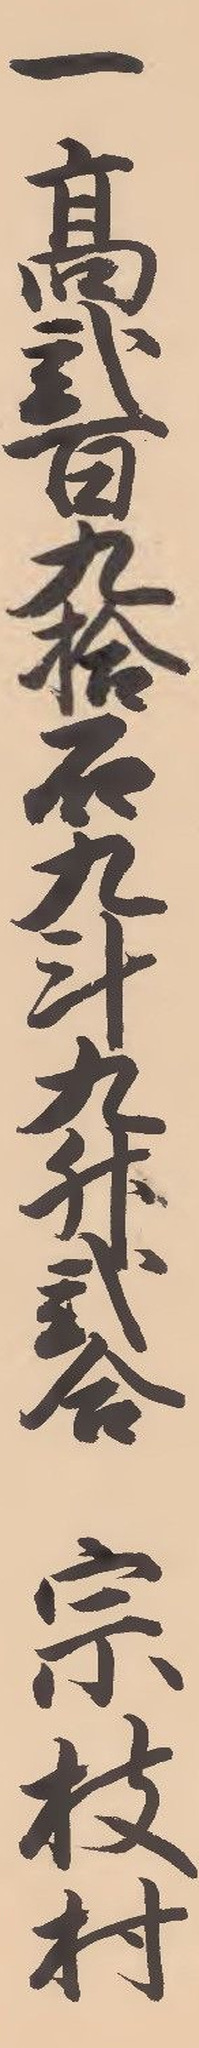一高弐百九拾石九斗九升弐合宗枝村
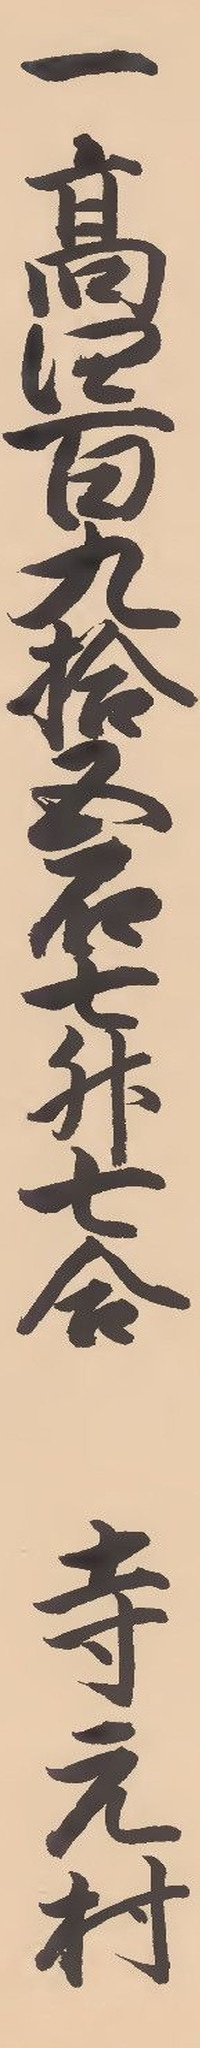一高四百九拾五石七升七合寺元村
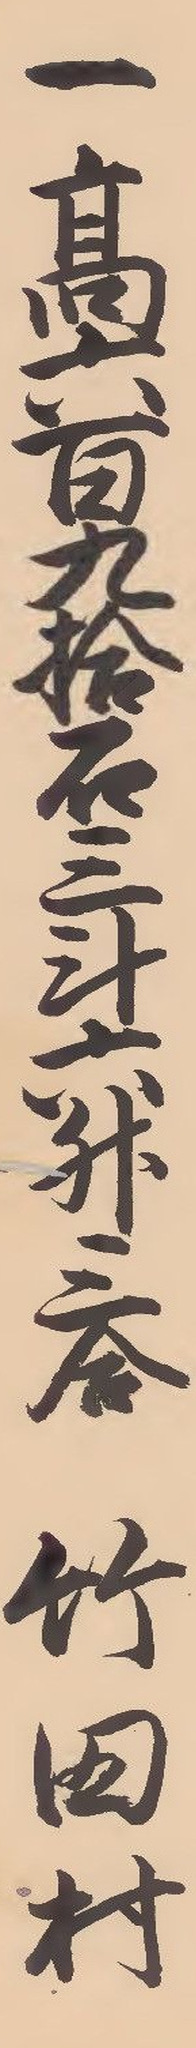一高六百九拾石三斗六升三合竹田村

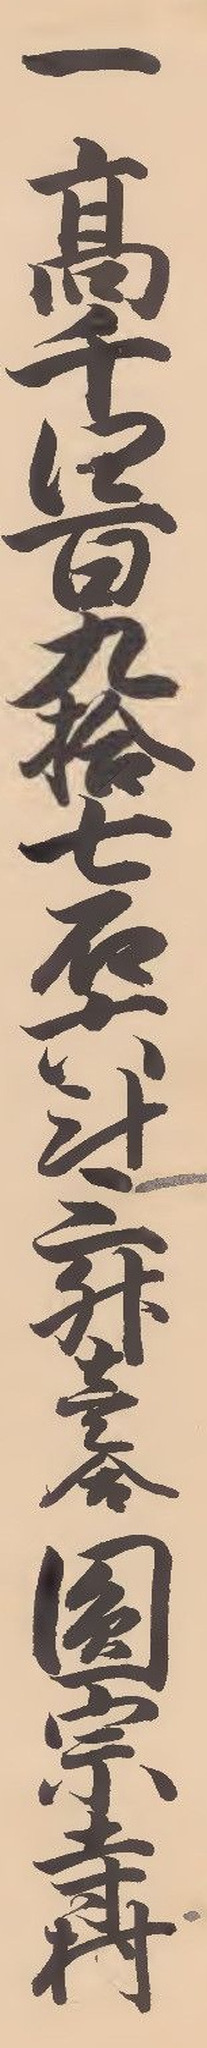一高千四百九拾七石六斗三升壱合円宗寺村
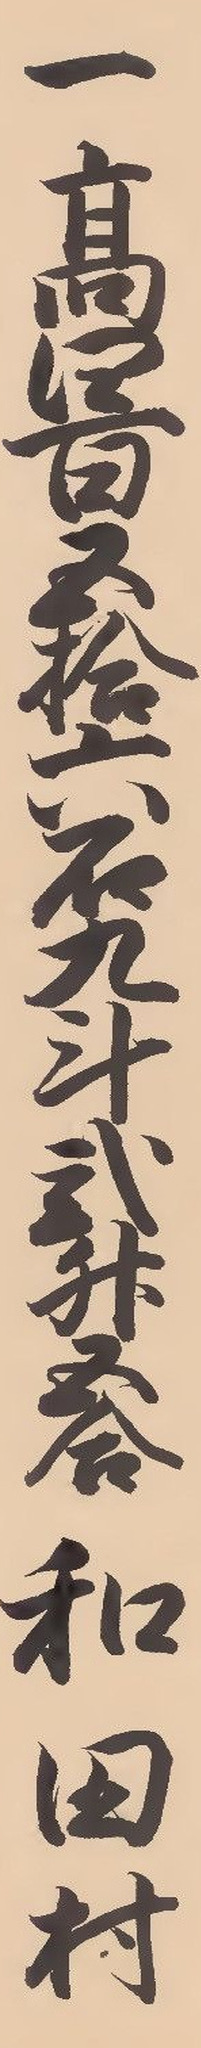一高四百五拾六石九斗弐升五合和田村
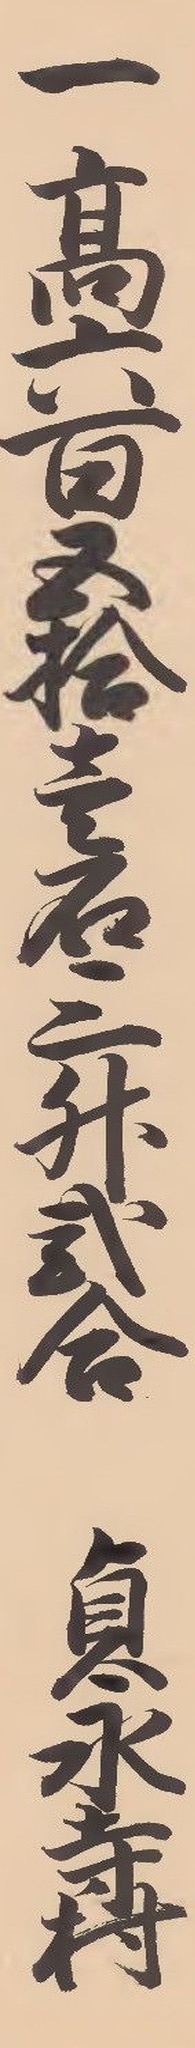一高六百五拾壱石三升弐合貞永寺村
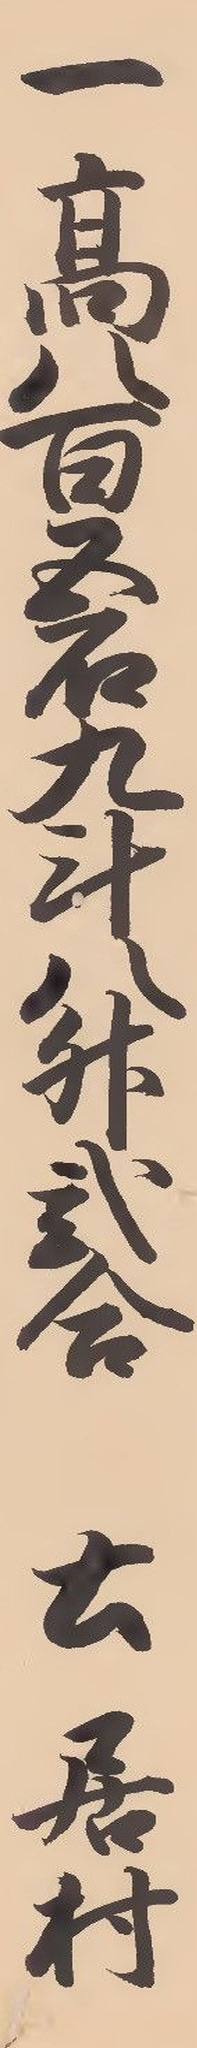一高八百五石九斗八升弐合土居村
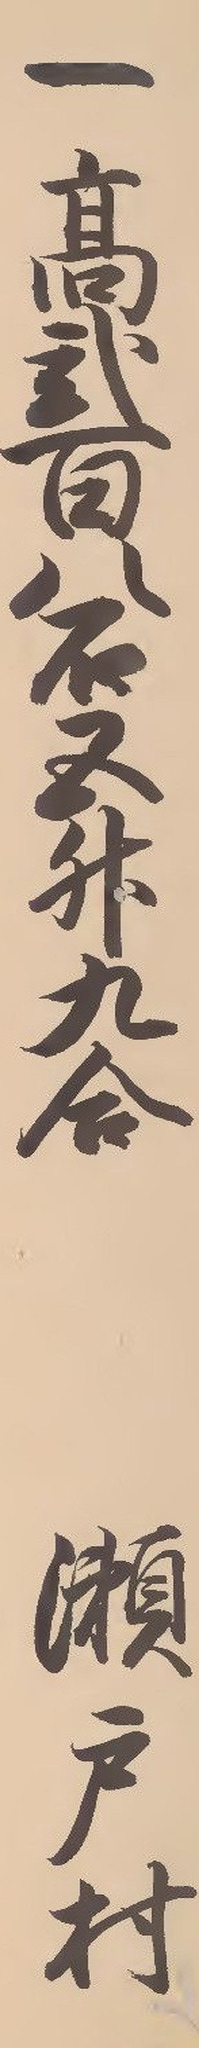一高弐百八石五升九合瀬戸村
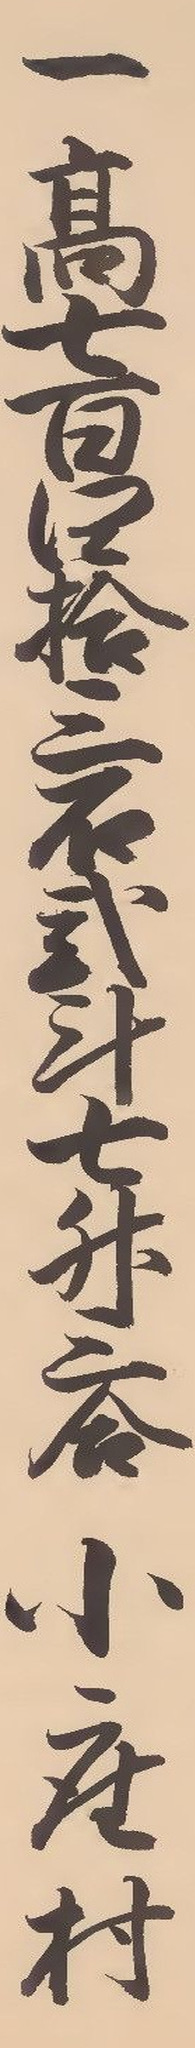一高七百四拾三石弐斗七升三合小座村
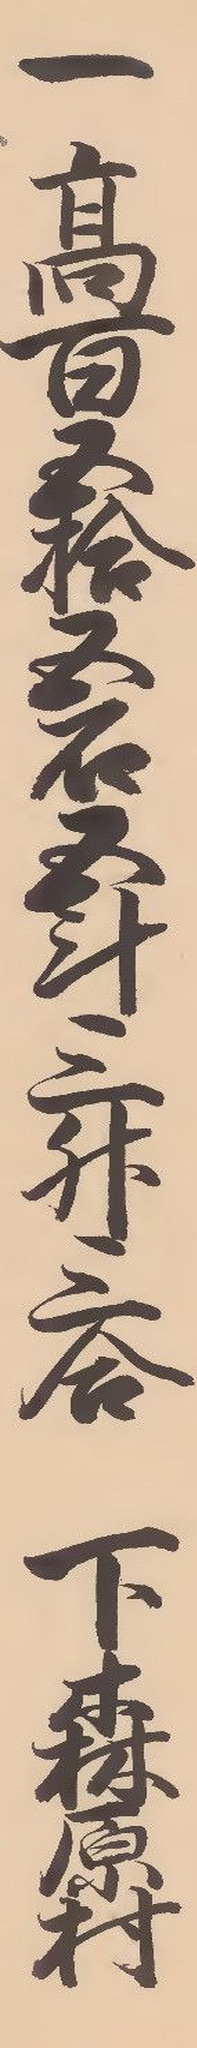一高百五拾五石五斗三升三合下森原村
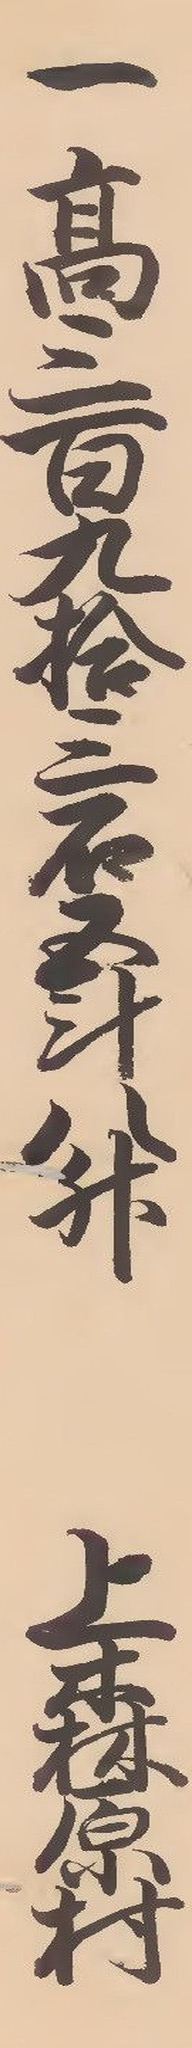一高三百九拾三石五斗八升上森原村

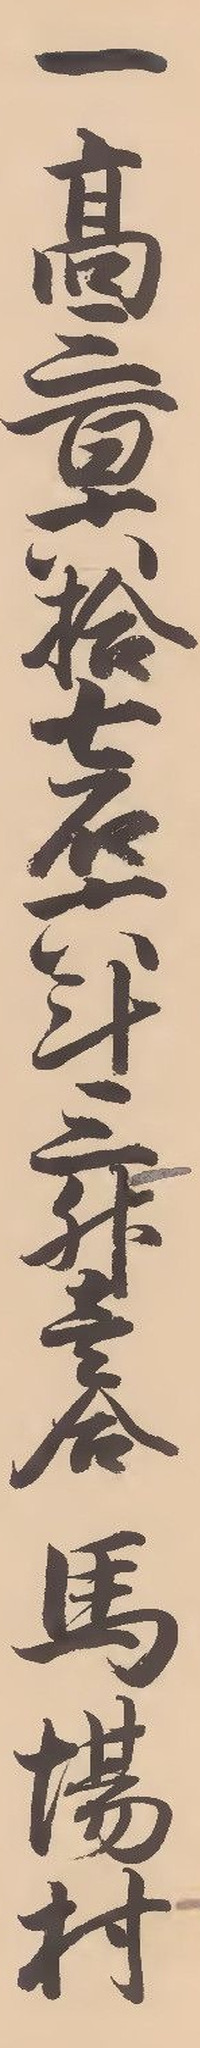一高三百六拾七石六斗三升壱合馬場村
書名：美作国郷帳
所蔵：国立公文書館 National Archives of Japan
